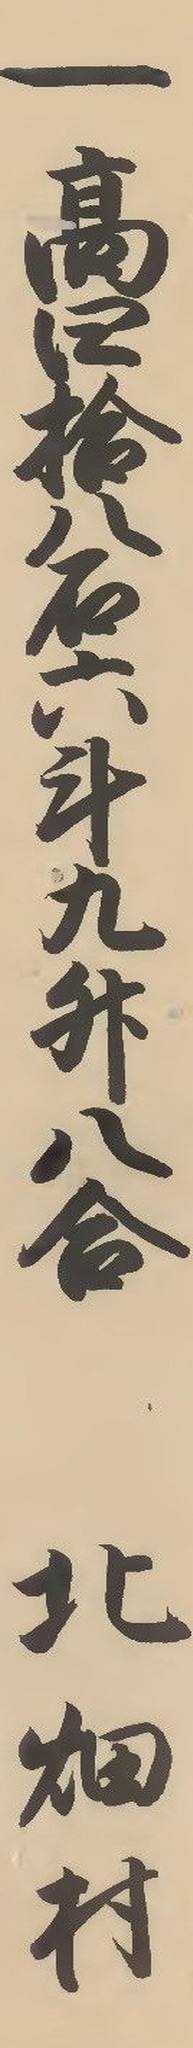一高四拾八石六斗九升八合北畑村
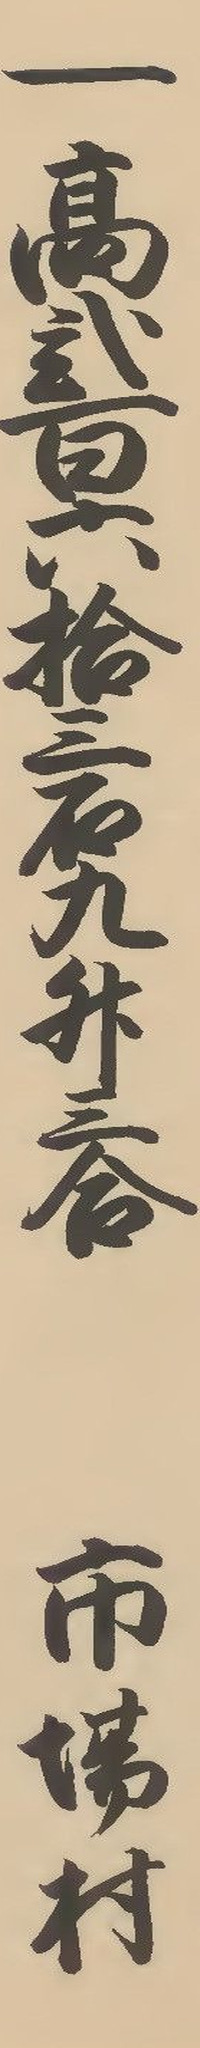一高弐百六拾三石九升三合市場村
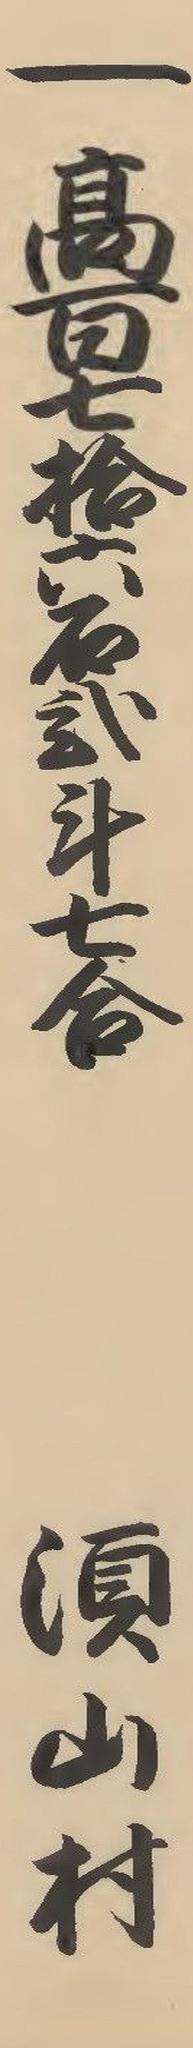一高百七拾六石弐斗七合須山村
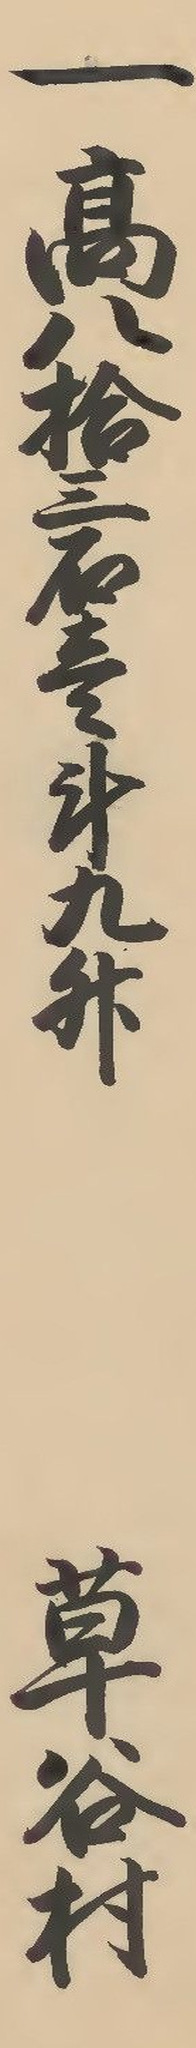一高八拾三石壱斗九升草谷村

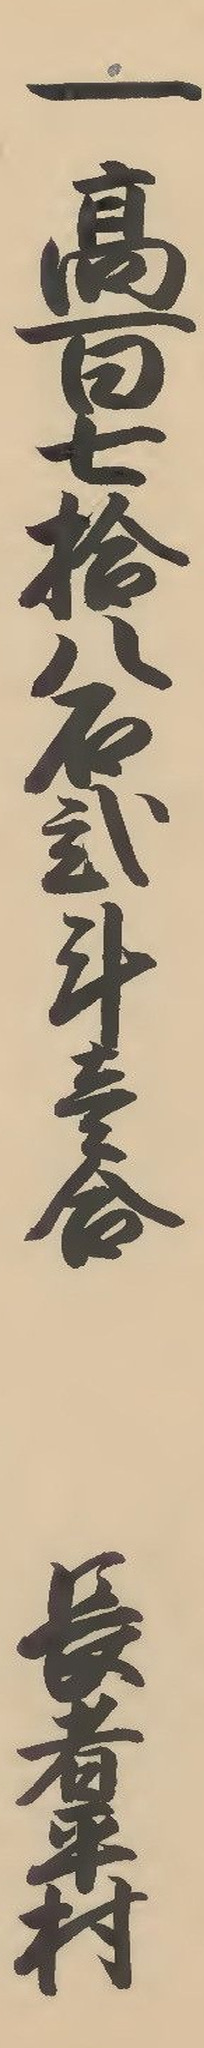一高百七拾八石弐斗壱合長者平村
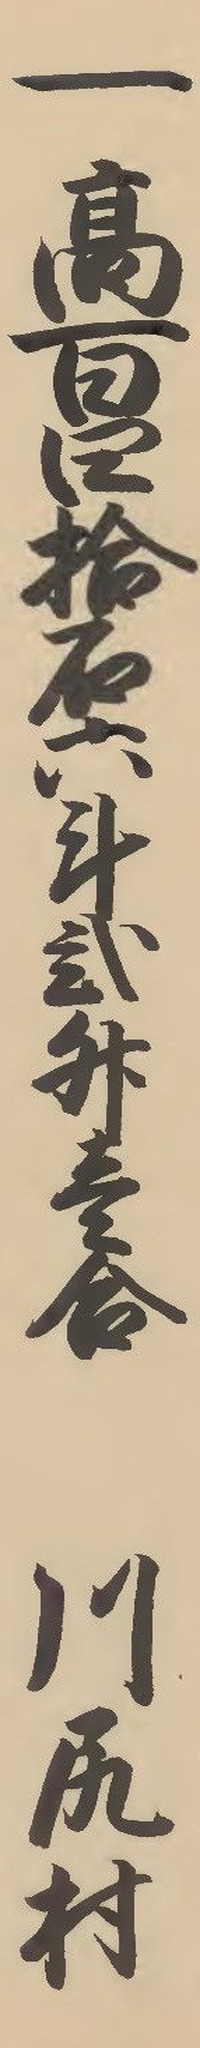一高百四拾石六斗弐升壱合川尻村
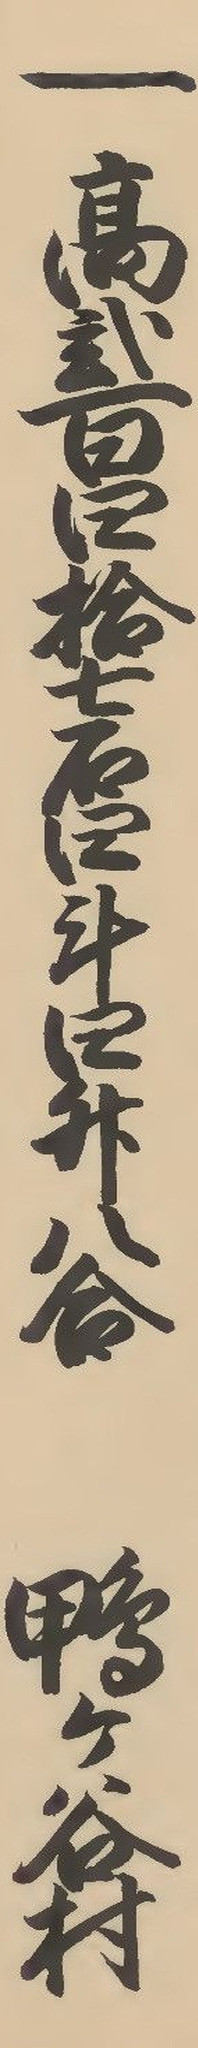一高弐百四拾七石四斗四升八合鴨ヶ谷村
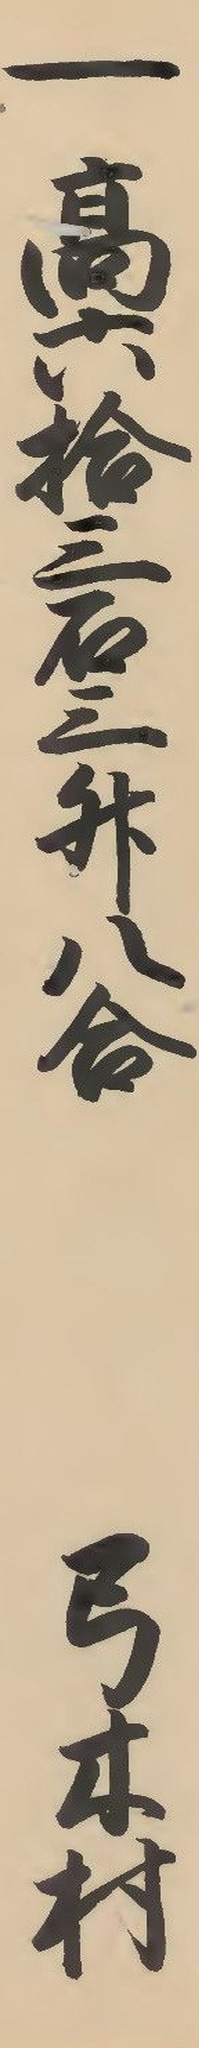一高六拾三石三升八合弓木村
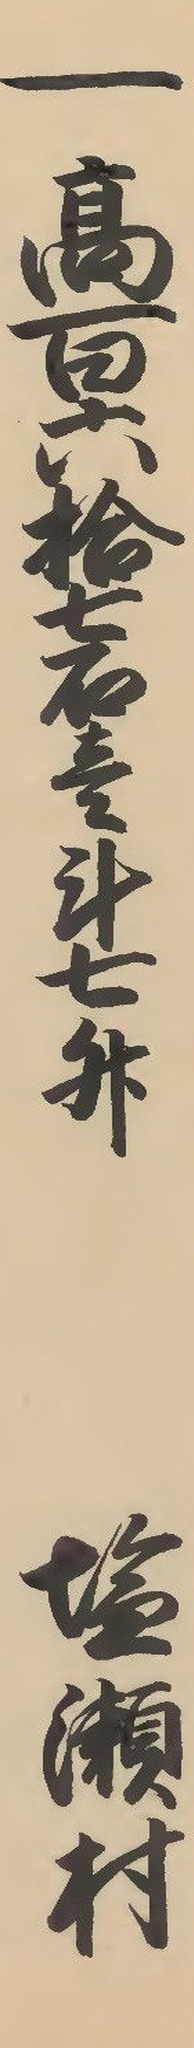一高百六拾七石壱斗七升塩瀬村
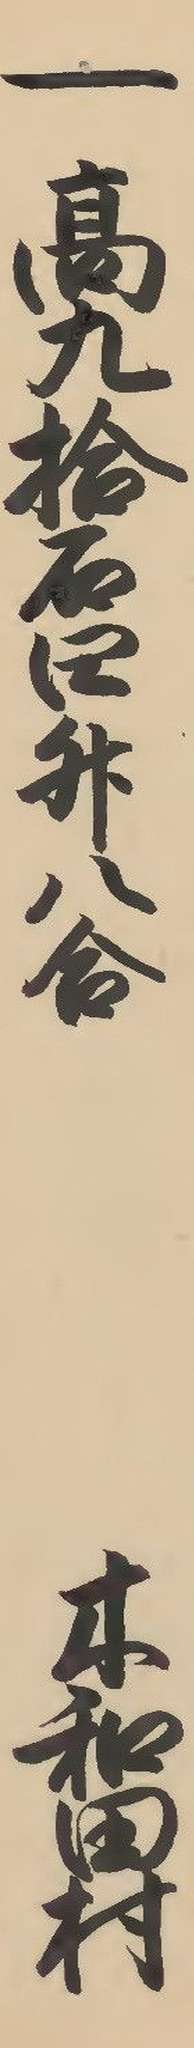一高九拾石四升八合木和田村

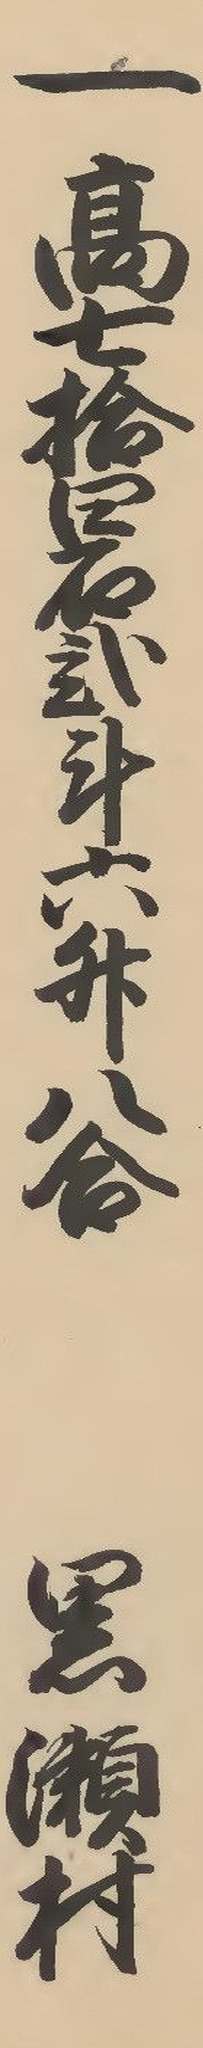一高七拾四石弐斗六升八合黒瀬村
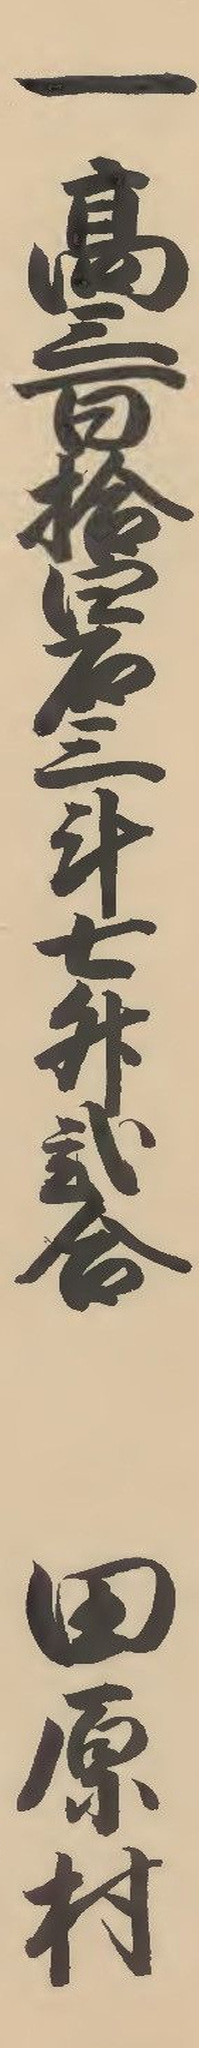一高三百拾四石三斗七升弐合田原村
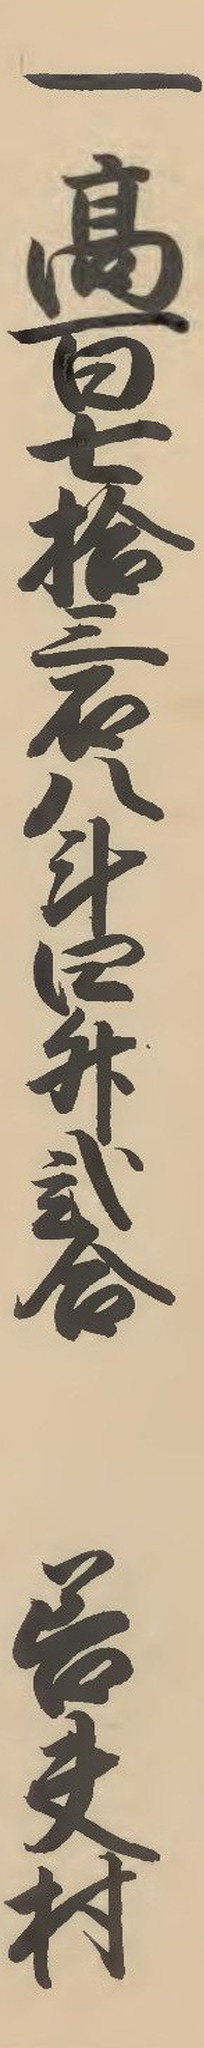一高百七拾三石八斗四升弐合善夫村
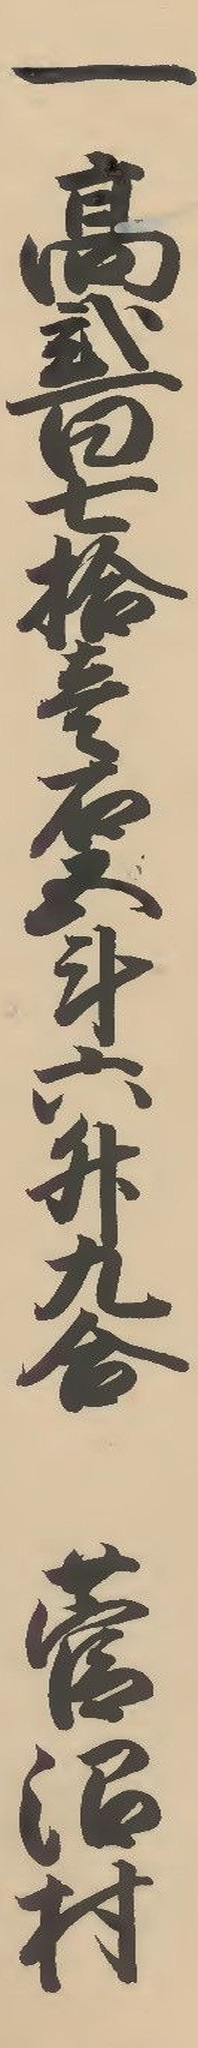一高弐百七拾壱石五斗六升九合菅沼村
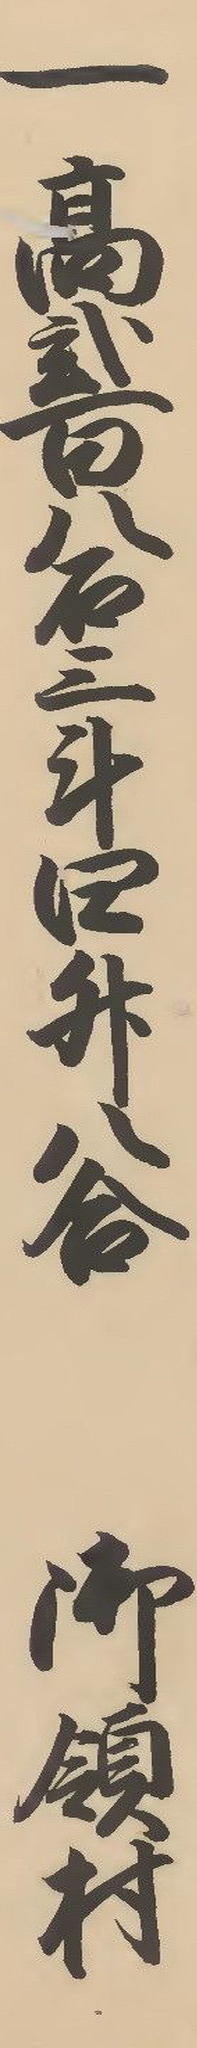一高弐百八石三斗四升八合御領村
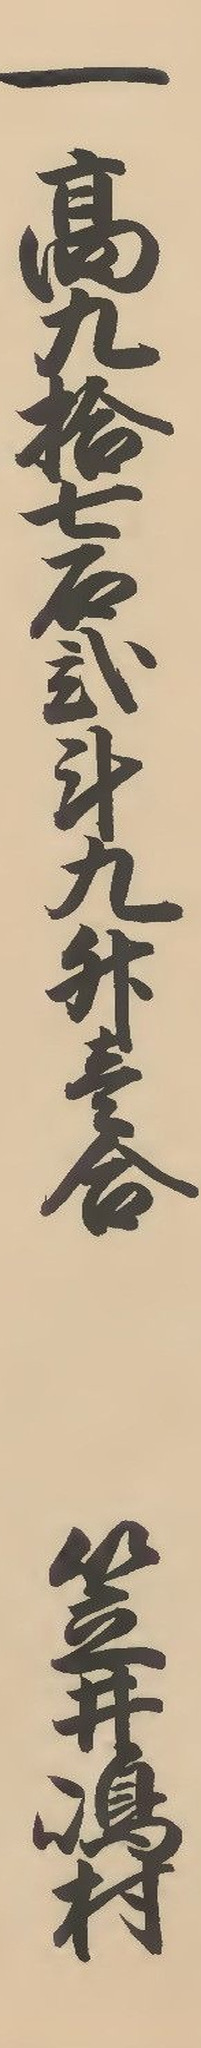一高九拾七石弐斗九升壱合笠井島村
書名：三河国郷帳
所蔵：国立公文書館 National Archives of Japan
